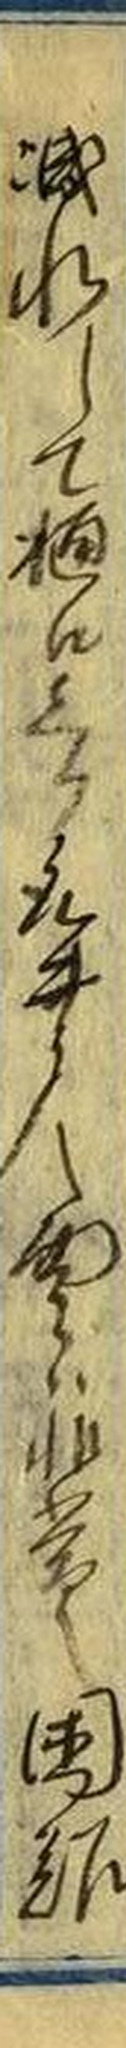減水して樋口上り取井戸之面々は非常之困難
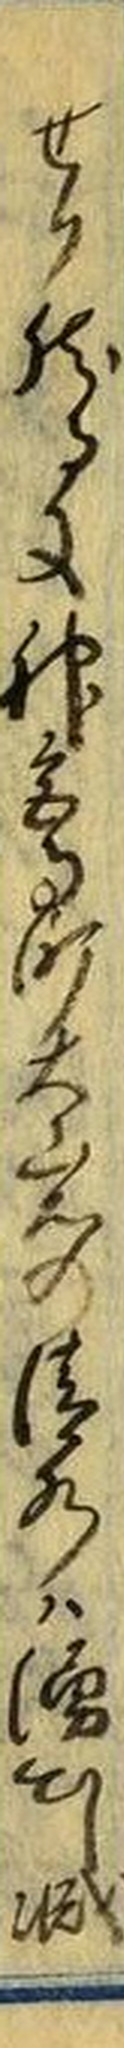せり然るに神宮寺町大岩の清水は湧出し減
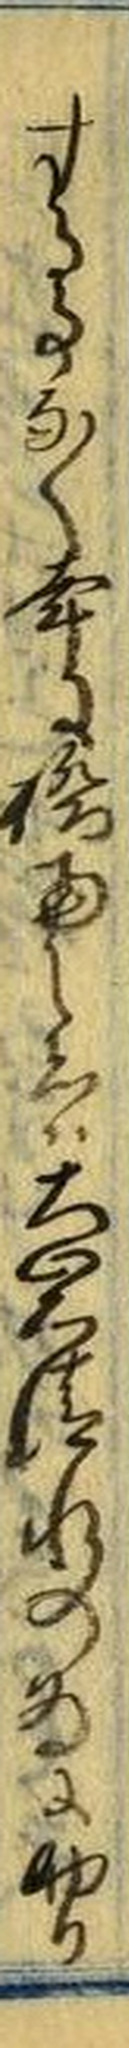する事なく幸に橋南之者は大岩清水の為に助り
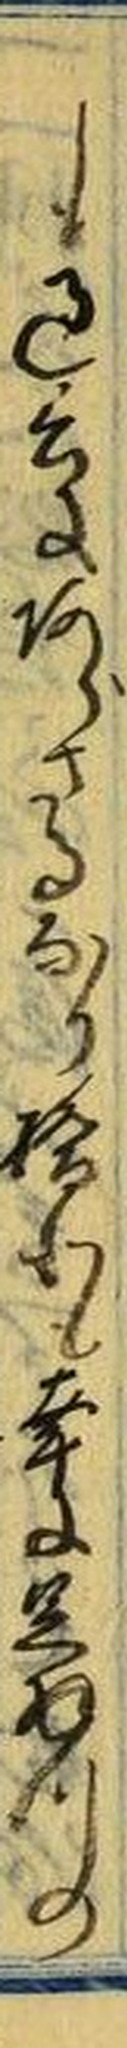しも過言にあらさるなり橋北も幸に足羽川の
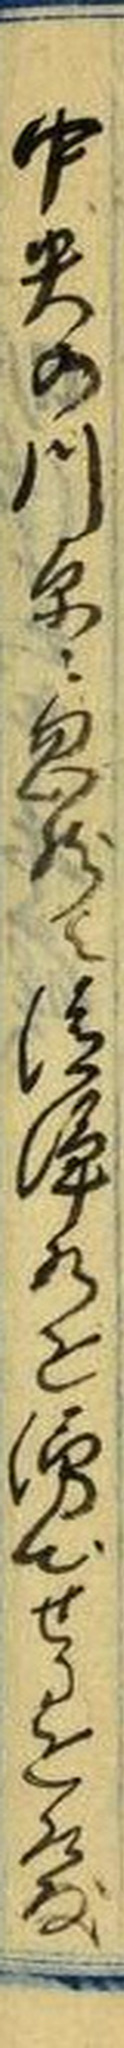中央の河原に忽然と清浄水を湧出せるを発
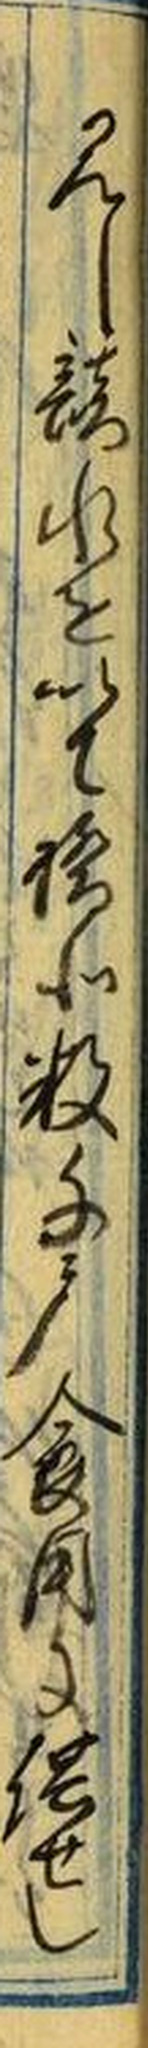見し該水を以て橋北数千戸食用に供せし
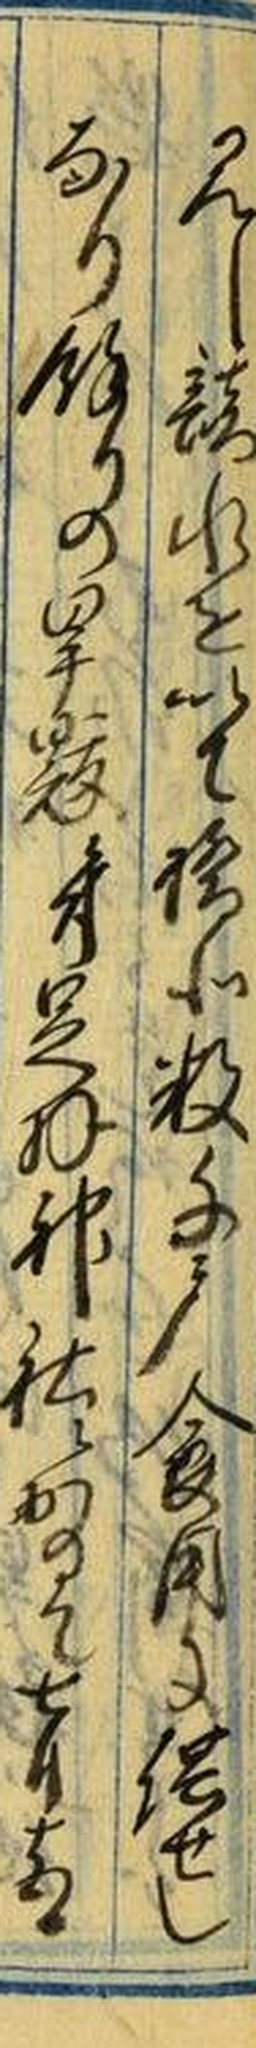なり餘りの旱魃に付足羽神社におゐて七月十五日
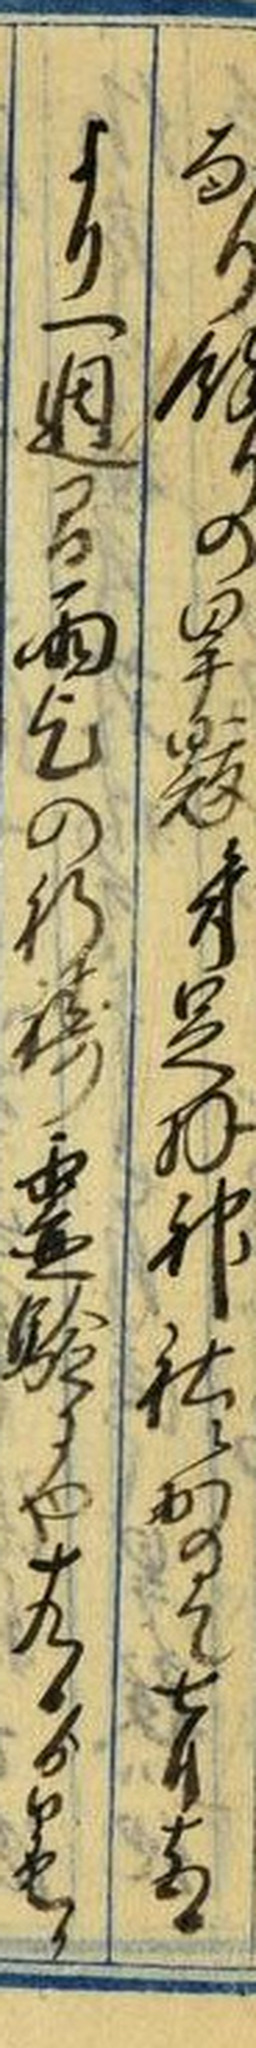より一週間雨乞の祈祷霊験にや十九日ゟ曇り
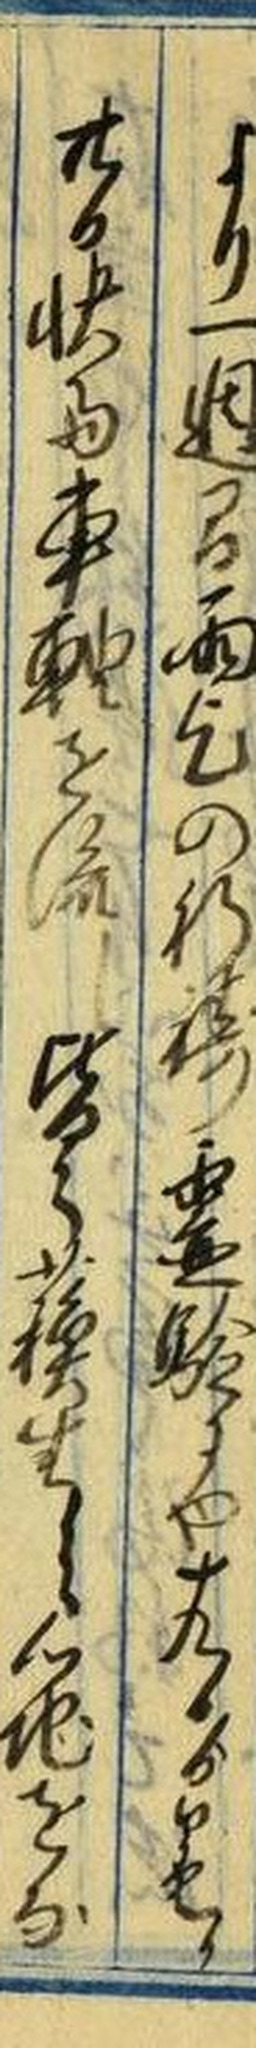廿日快雨車軸を流し皆々蘓生之心地をな
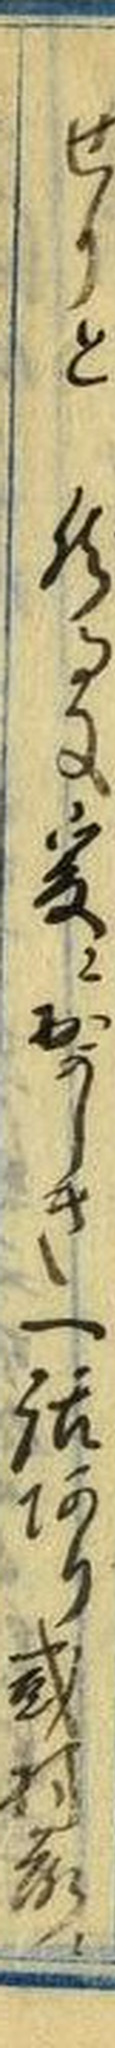せりと然るに爰におかしき一話あり或村落に
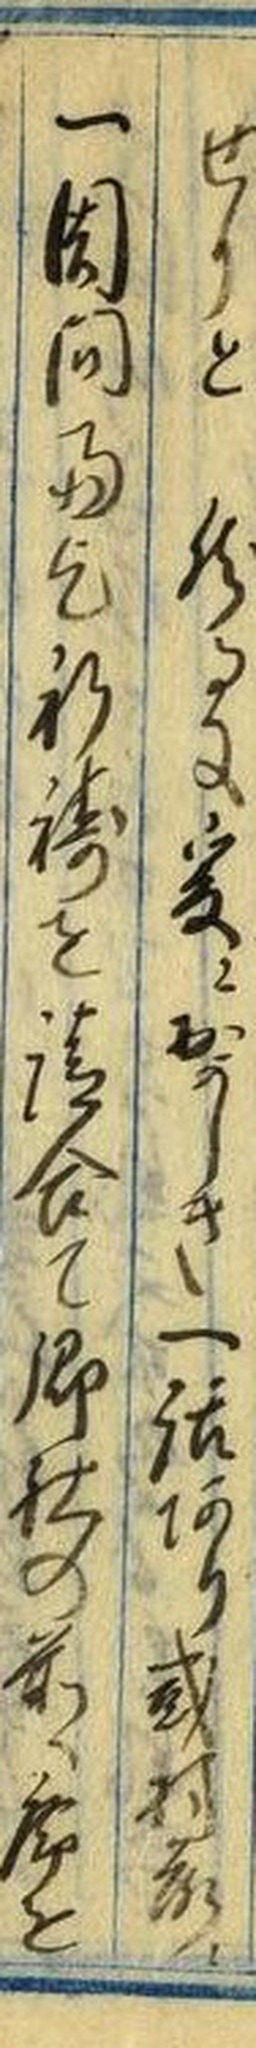一周間雨乞祈祷を請合て郷社の前へ席を
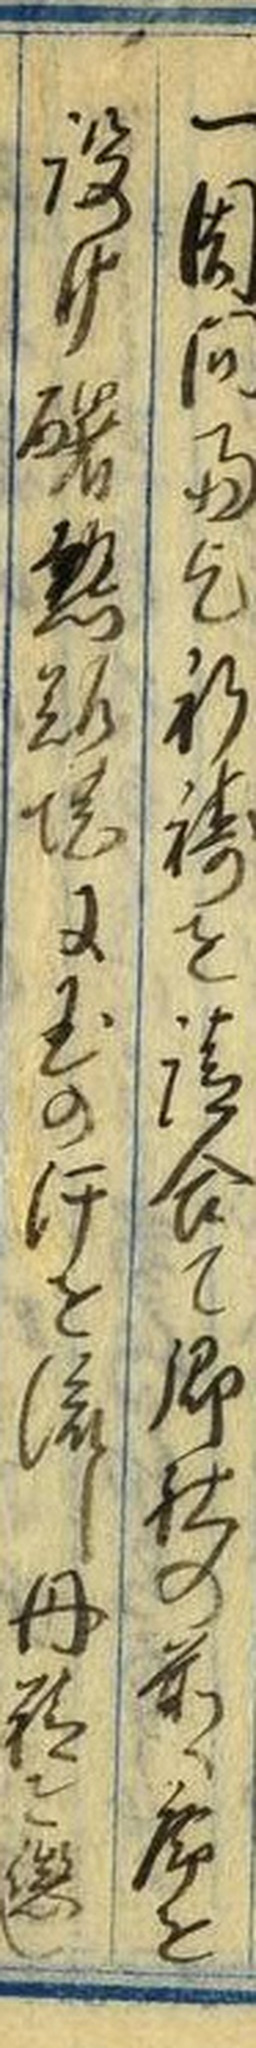設け暑熱難堪に玉の汗を流し丹精を懲し
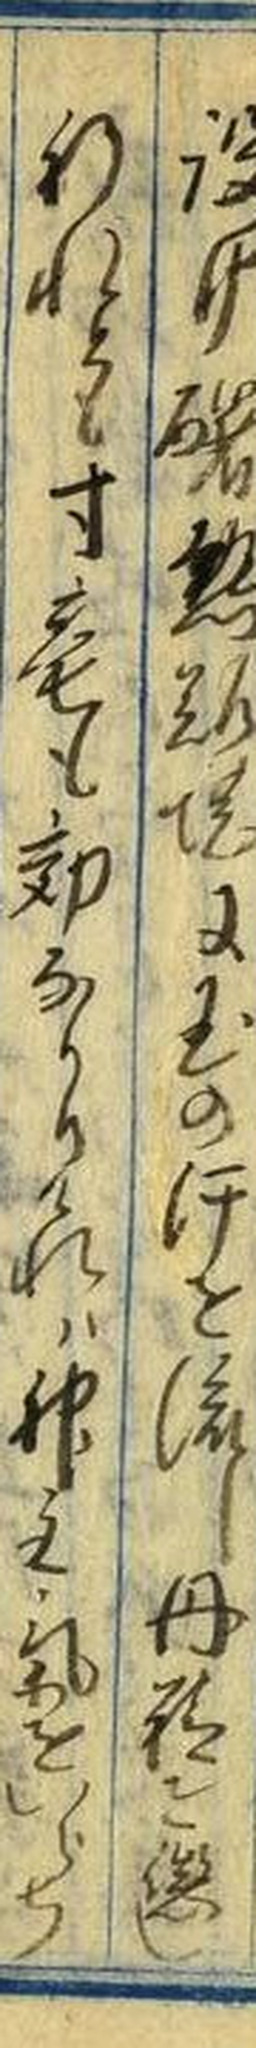祈れとも寸毫も効なかりけれは神主気をいらち
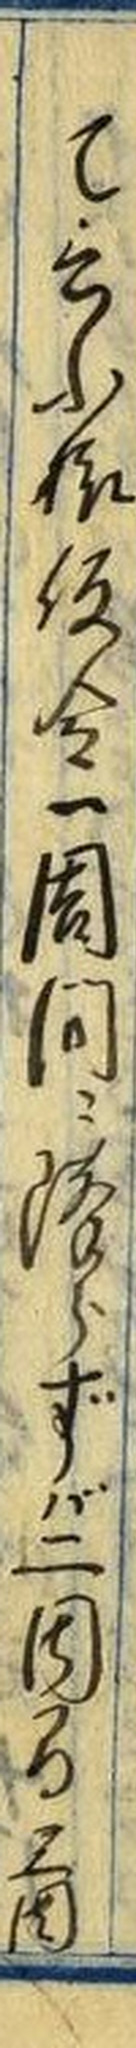て言ふ様仮令一周間に降らずば二周間三周
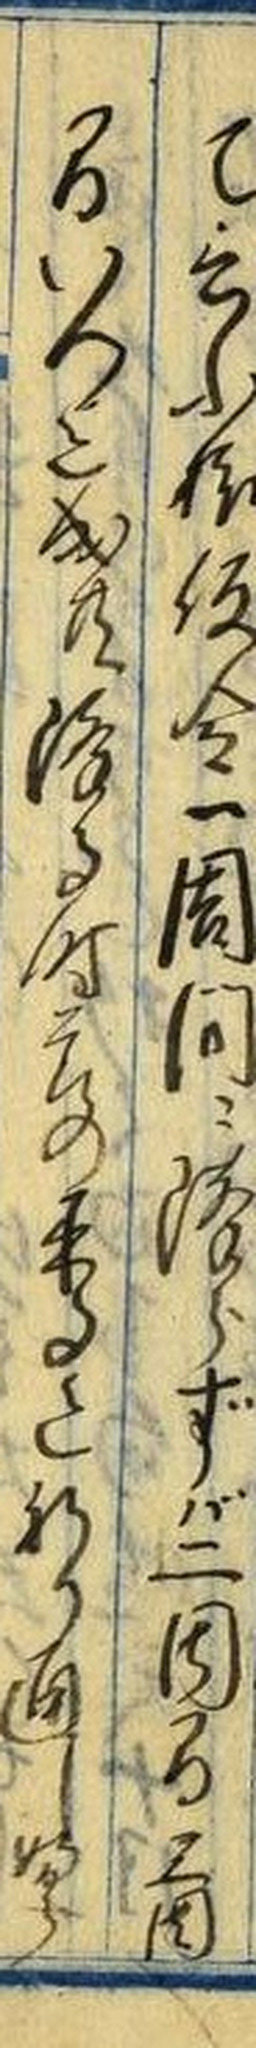間いつ迄成共降る時節の来る迄祈り通しふら

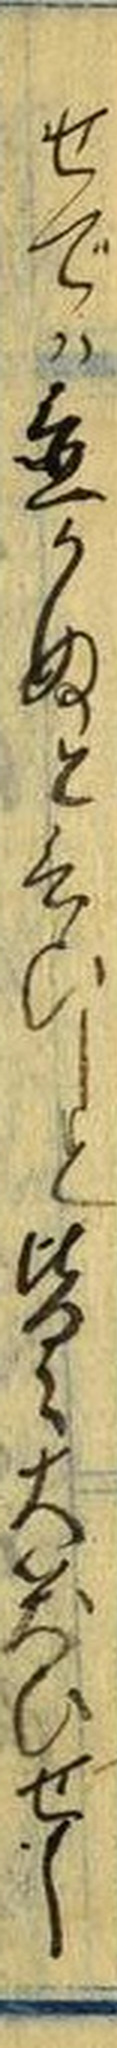せでは置かぬと言ひしと皆々大笑ひせし
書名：温古集 五巻
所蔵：福井県文書館 Fukui Prefectural Archives
